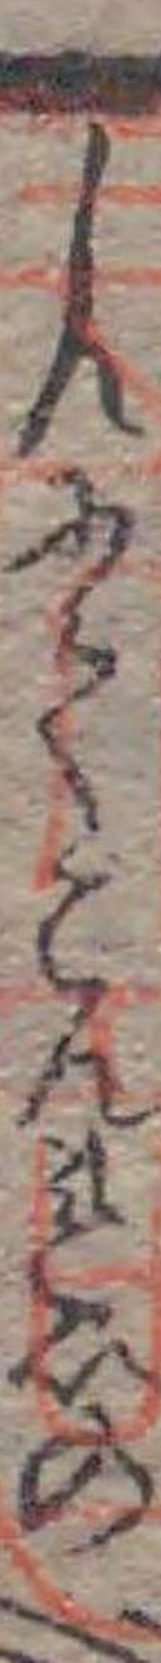しんにてこんれいの
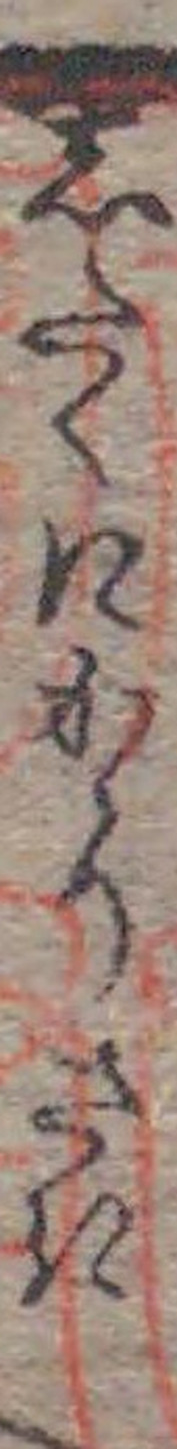したくにかゝりさき
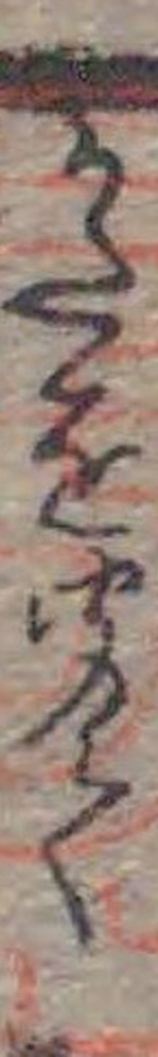かたを聞て
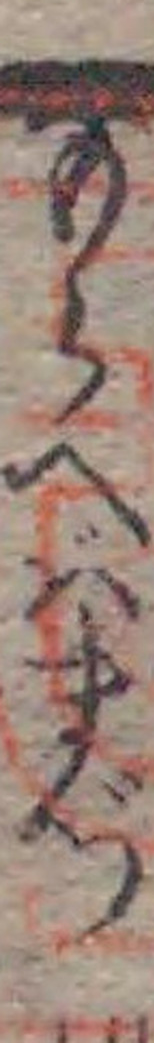もらへばまづ
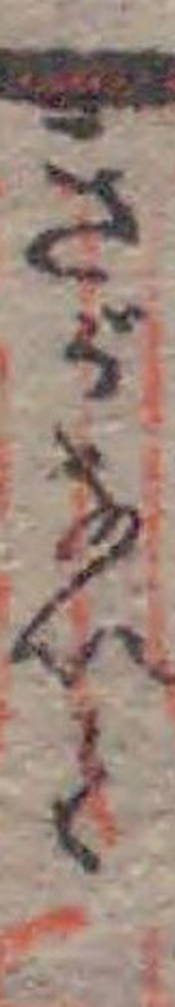きがないと
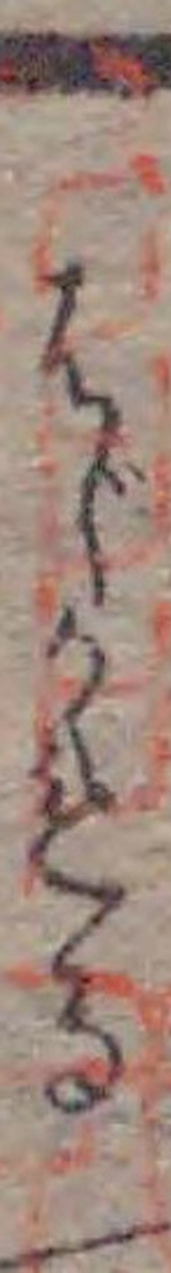はじかれる
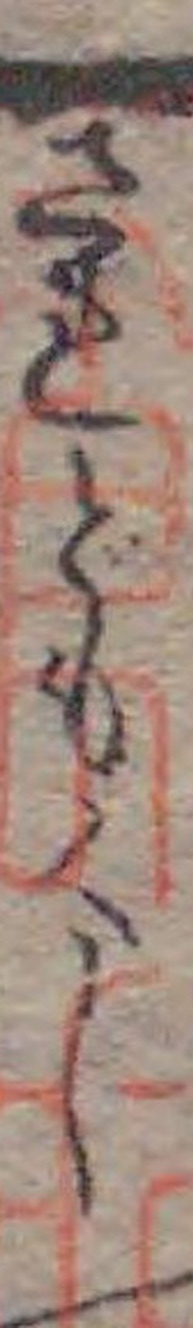されどもくし
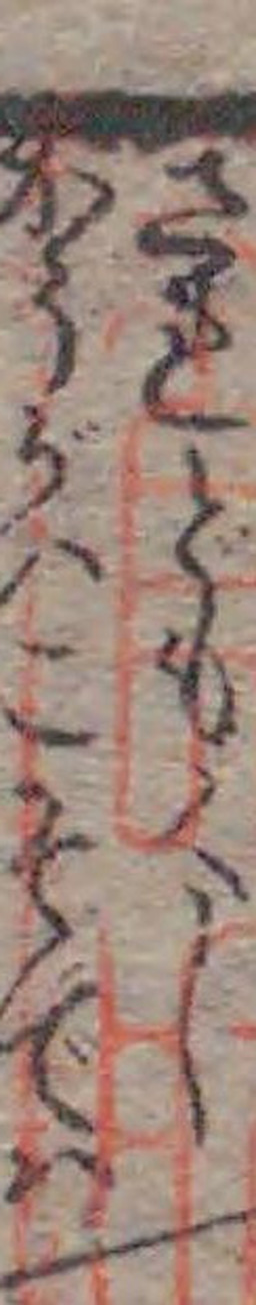かうがいこそでは
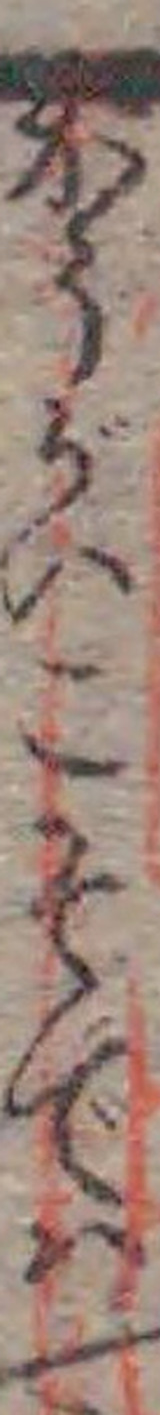かうがいこそでは
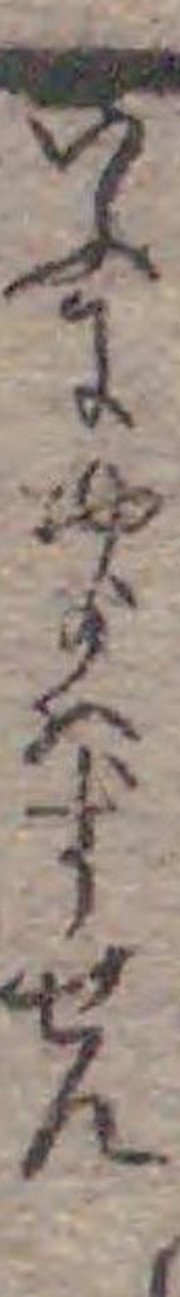いふにおよはずせん
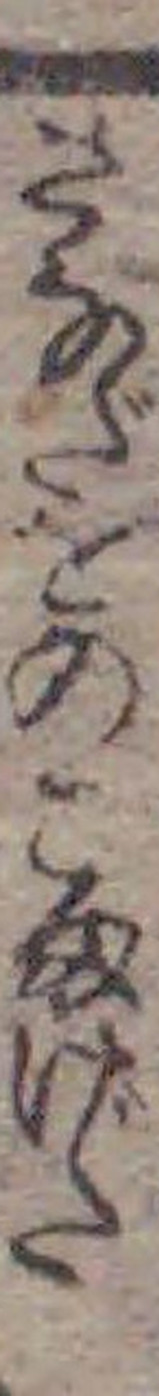さなだをのこまげた
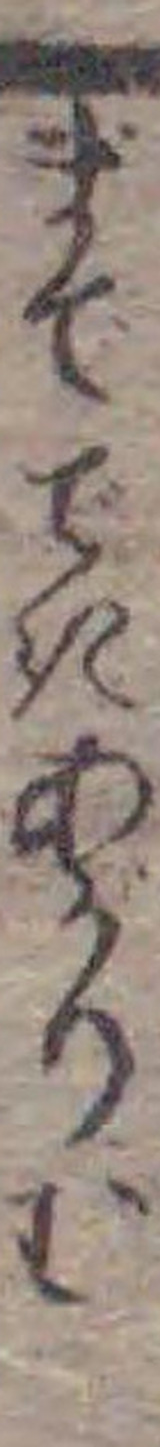まてできあがりむ
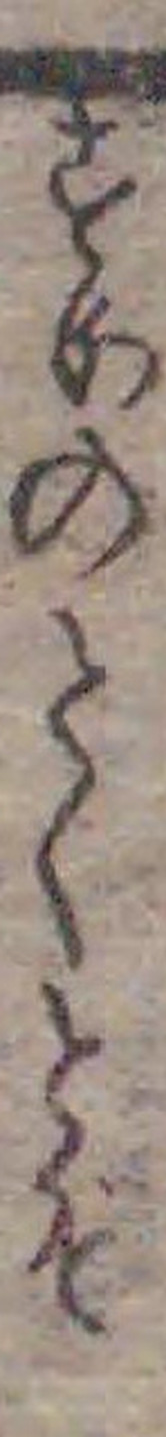すめのとくとぞ
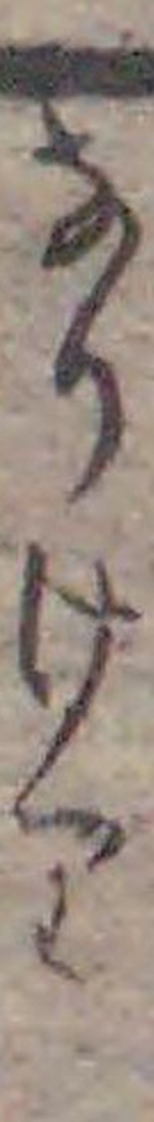なりけり

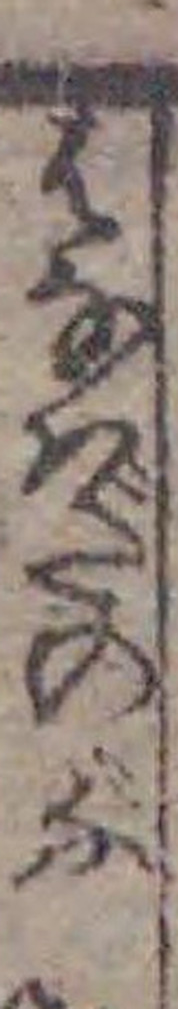はなはだのぶ
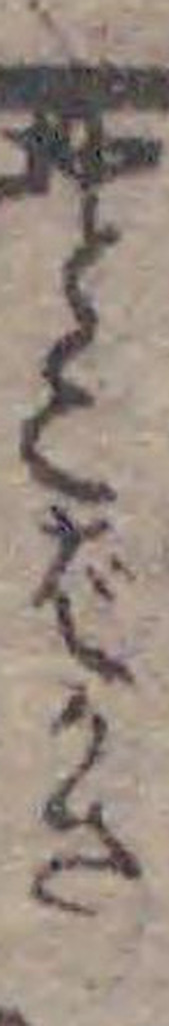おとこばかさ
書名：紺屋百物語 : 3巻
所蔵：国立国会図書館 National Diet Library, JAPAN
